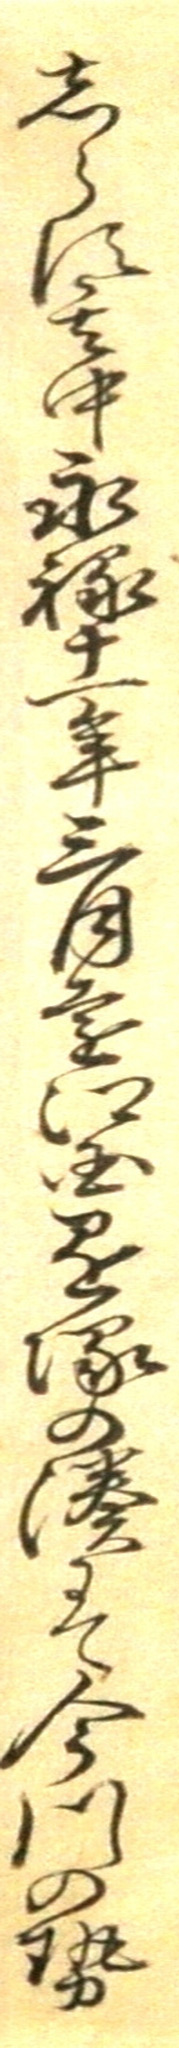しらす其中永禄十一年三月遠江国懸塚の湊にて今川の勢
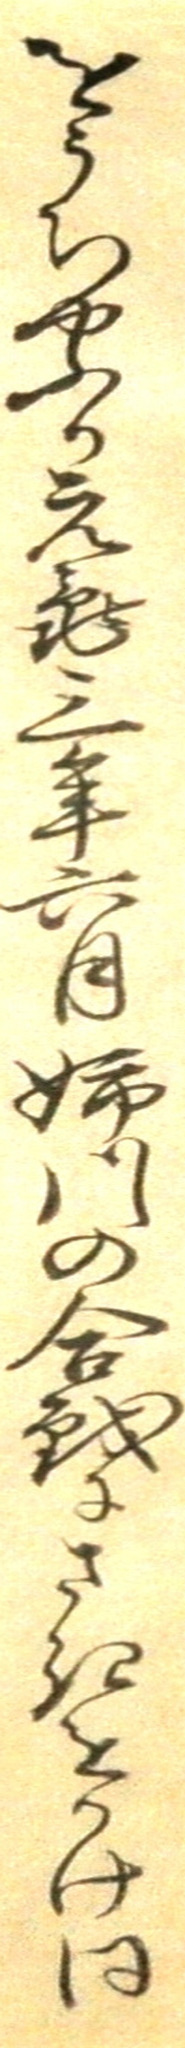をうちやふり元亀三年六月姉川の合戦にさきをかけ同
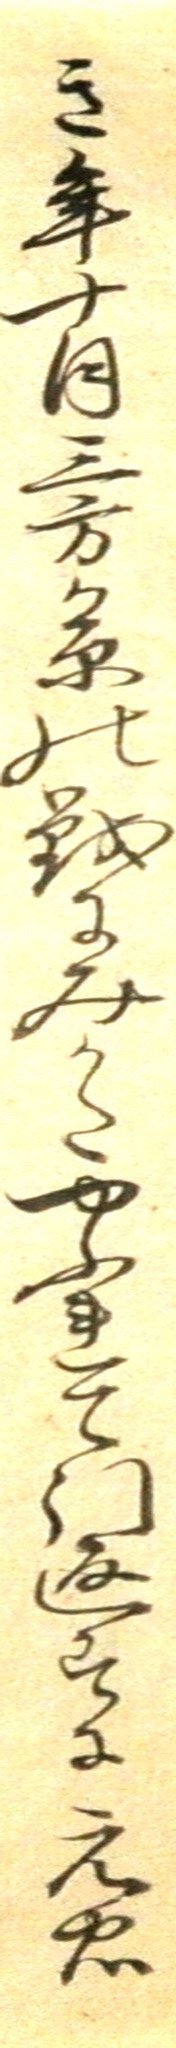き年十月三方か原の戦にみかたやふれて引返すに元忠
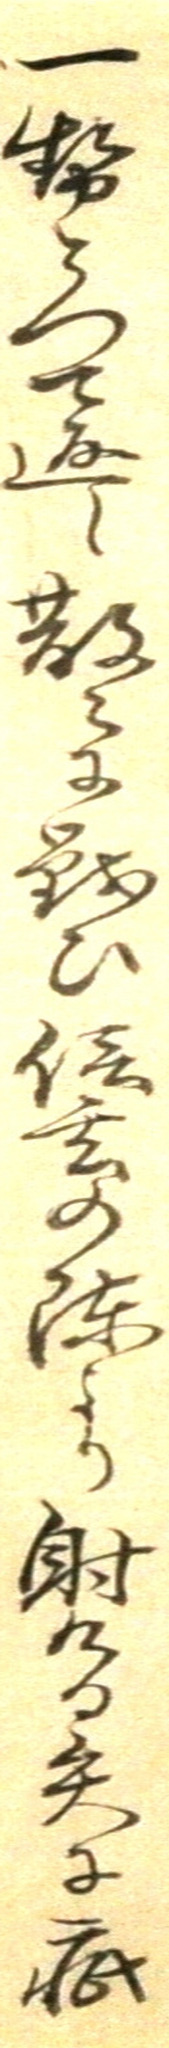一勢とつて返し散々に戦ひ信玄の陣より射ける矢に疵
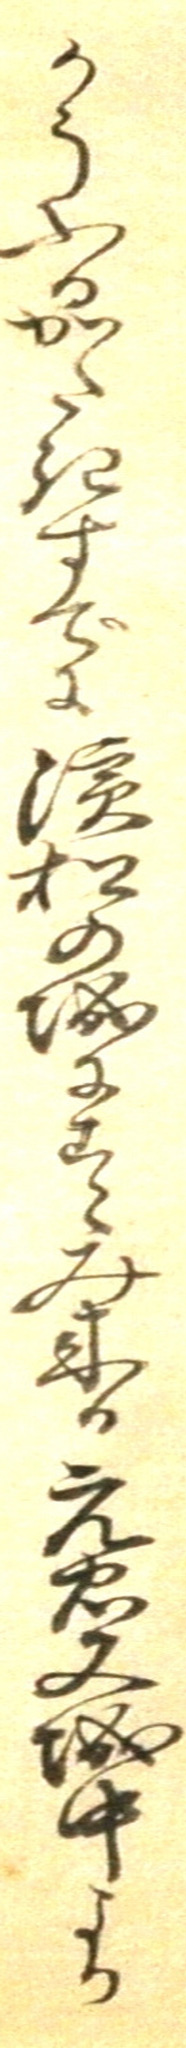かうふるかたきすでに浜松の城にすゝみ来る元忠又城中より
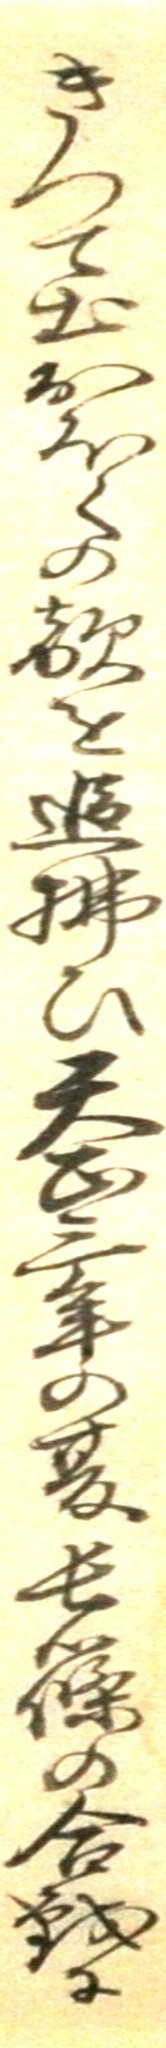きつて出おほくの敵を追払ひ天正三年の夏長篠の合戦に
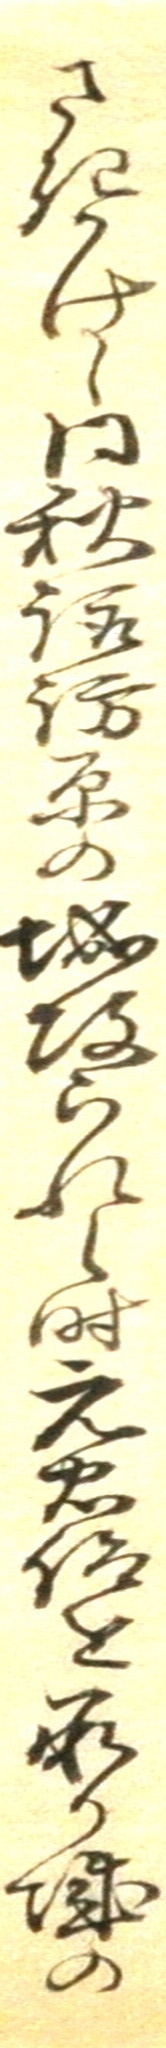さきかけし同秋諏訪原の城攻られし時元忠仰を承り城の
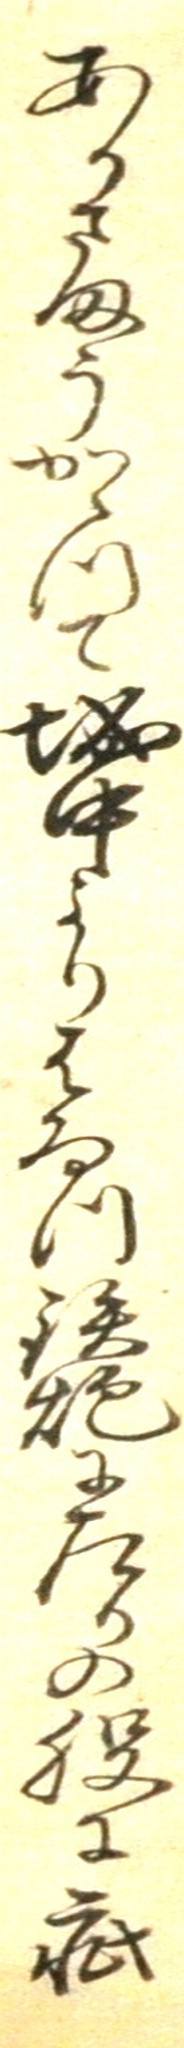ありさまうかゝつて城中よりはなつ鉄炮に左りの股に疵
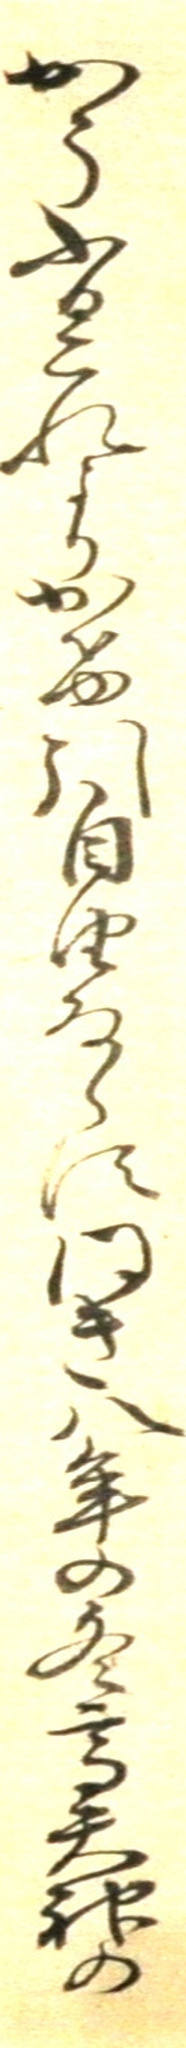かうふるこれよりかけ引自由ならす同き八年の冬高天神の
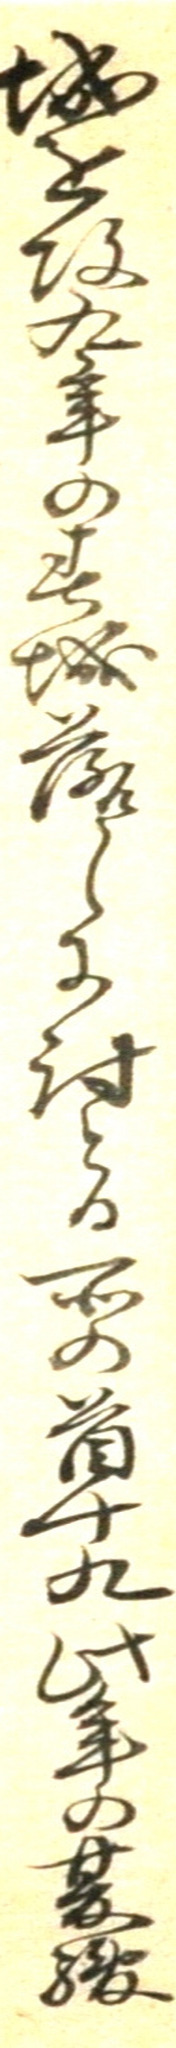城を攻九年の春城落しに討とる所の首十九此年の夏駿
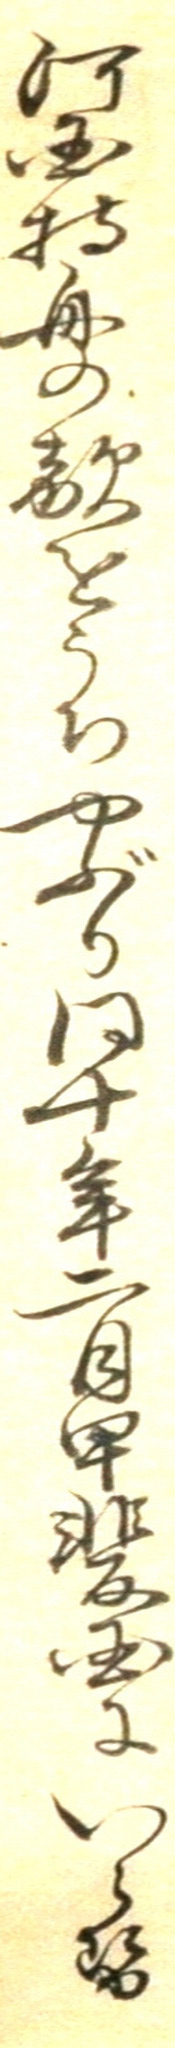河国持舟の敵をうちやぶり同十年二月甲斐国にいらせ
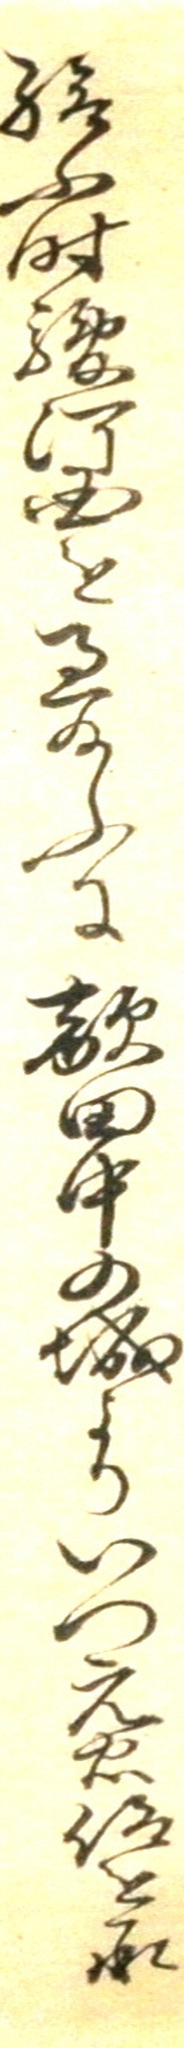給ふ時駿河国を過給ふに敵田中の城よりいつ元忠仰を承
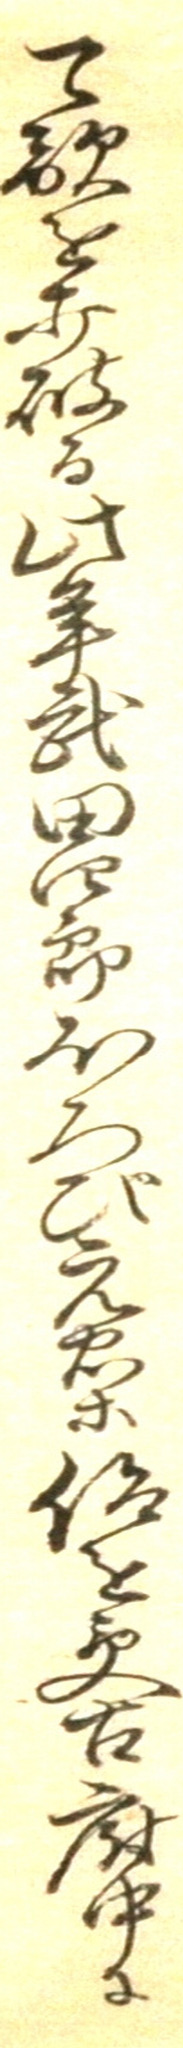て敵を打破る此年武田四郎ほろび元忠等仰を受古府中に
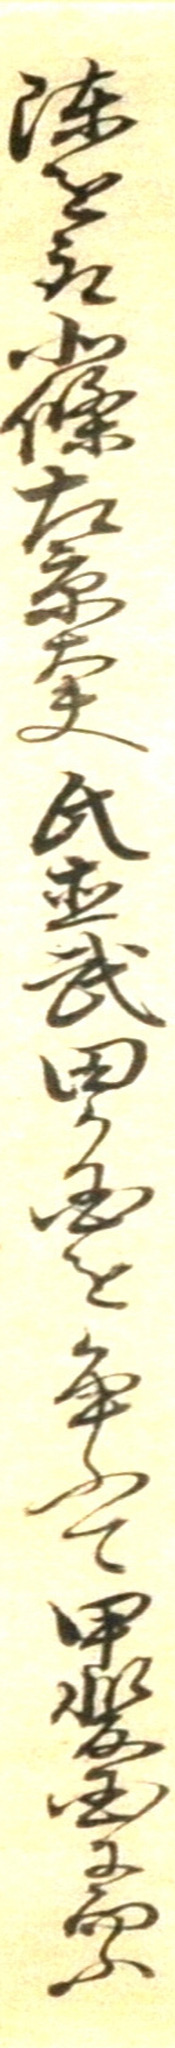陣を取北條左京大夫氏直武田か国を争ふて甲斐国に向ふ
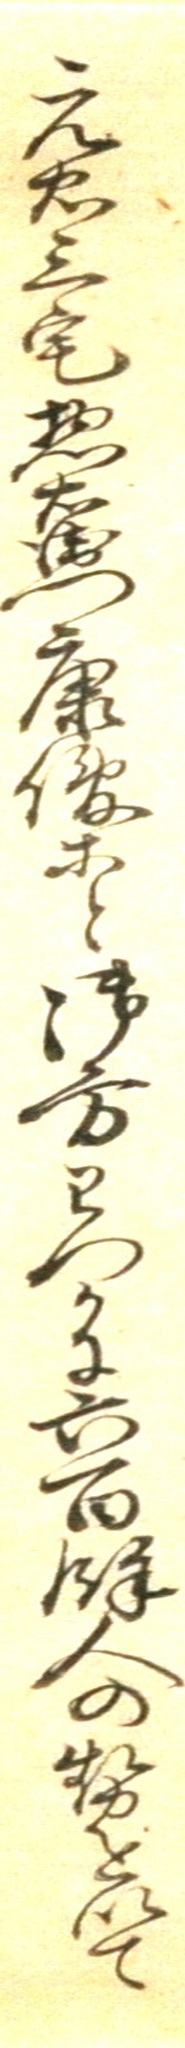元忠三宅惣右衛門康俊等と御方わつかに六百余人の勢を以て
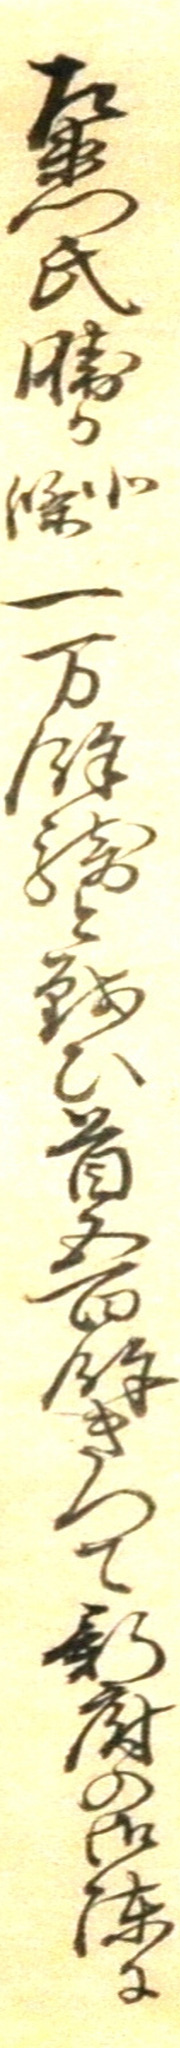左衛門氏勝か北條一万余騎と戦ひ首五百余きつて新府の御陣に
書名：藩翰譜（四・中）
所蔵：伊那市立高遠町図書館・合同会社AMANE
